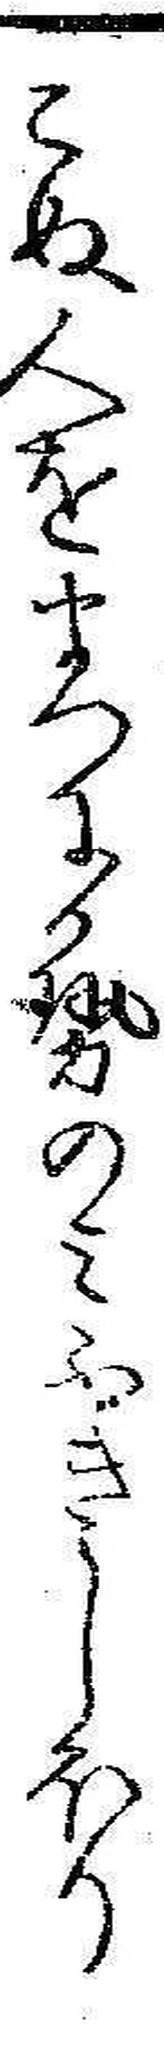こぬ人をまつより勢のみふきしほり
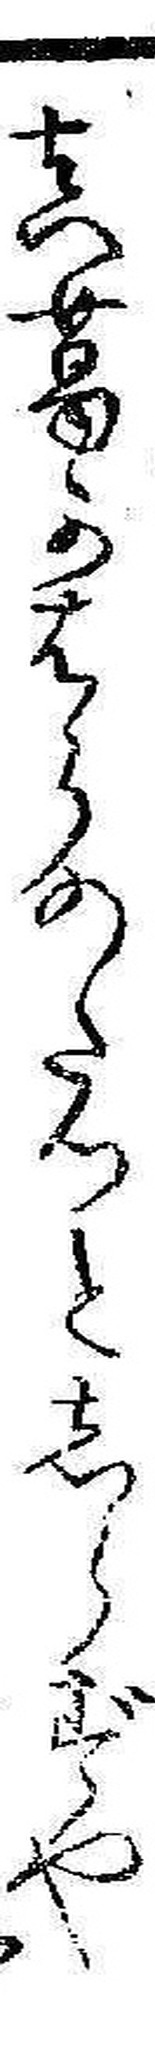真葛かはらのたつとしらずや
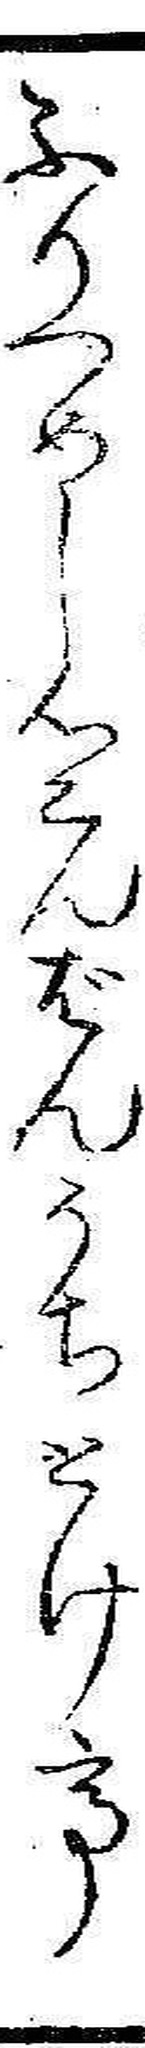ふりつめし心こんばんうちとけて
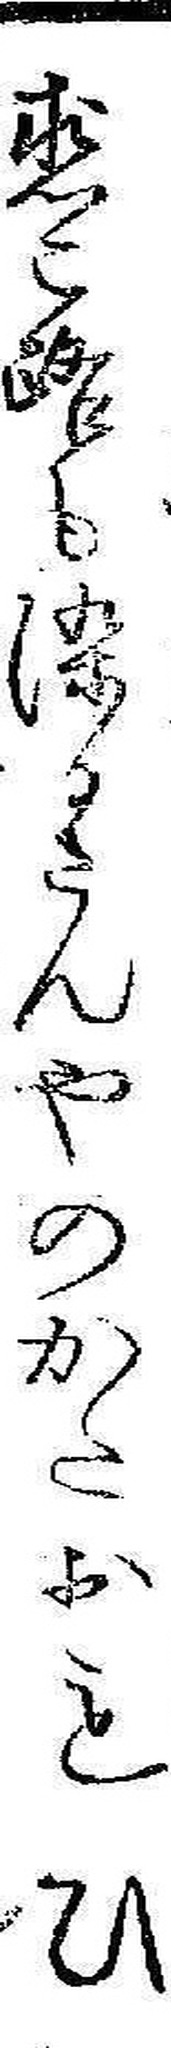恋路も染めるたんやのかたおもひ
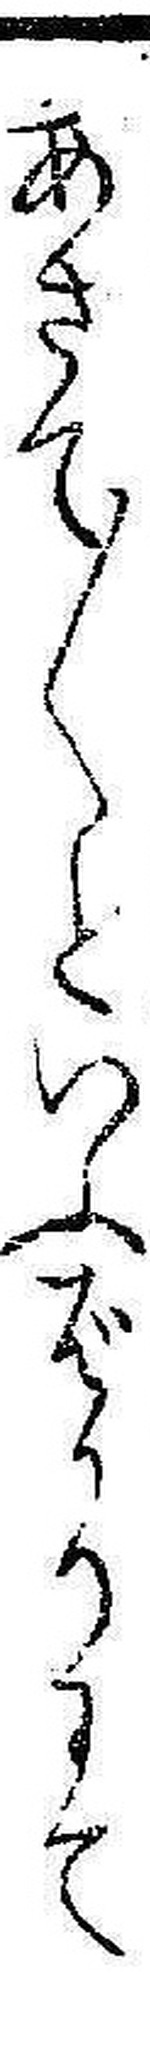あさて〳〵といふばかりにて
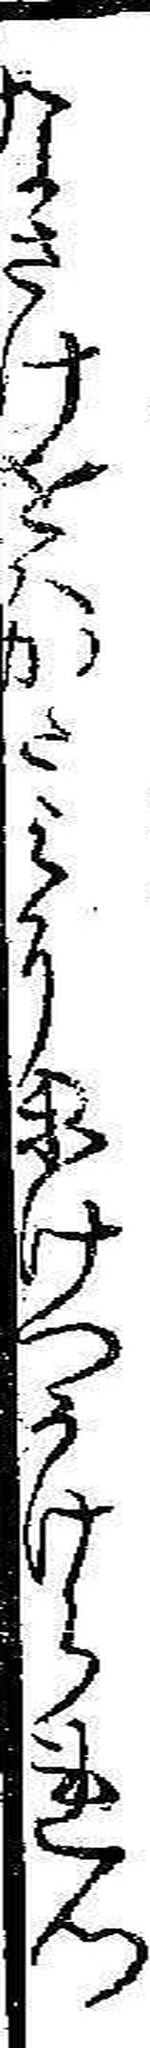なさけをはかたみけつかけられつ
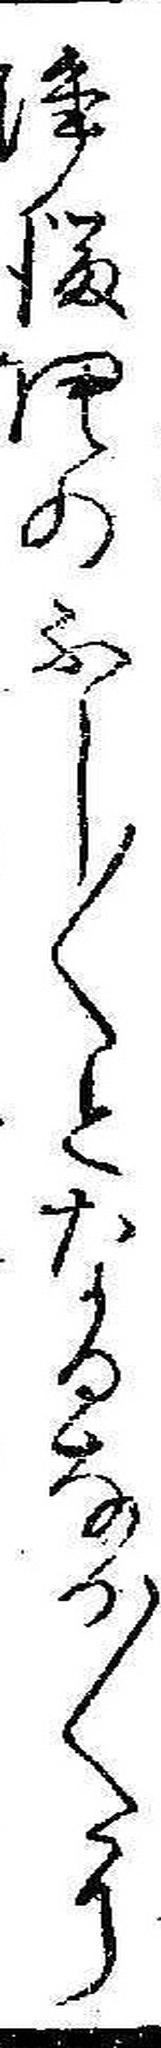浄瑠璃のふし〳〵となるなか〳〵に
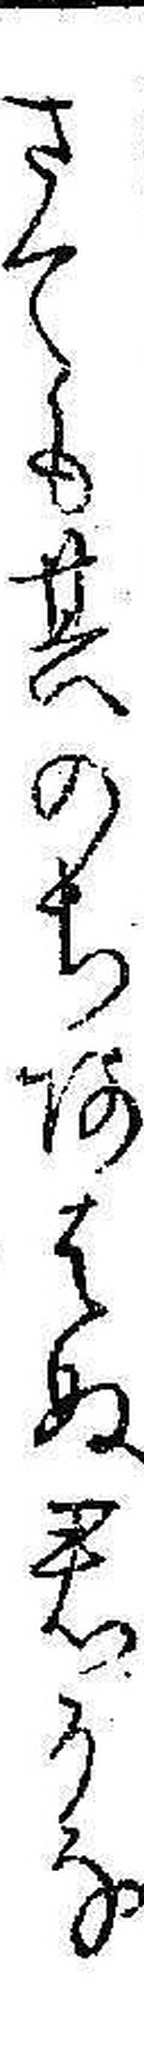さても其のちあはぬ君かな
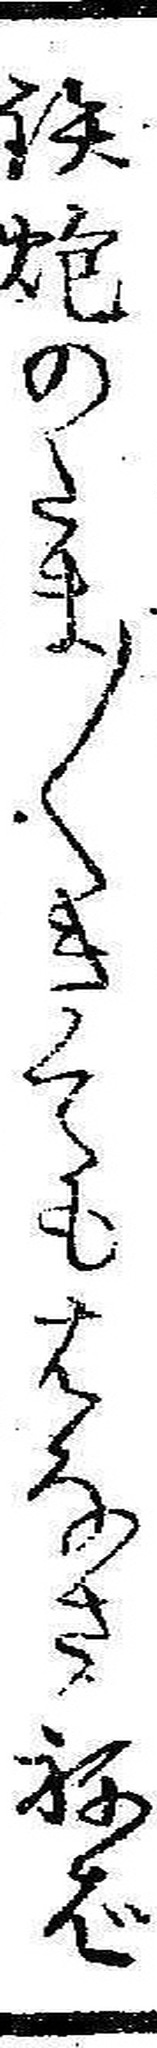鉄炮のたま〳〵きてもはなさねば
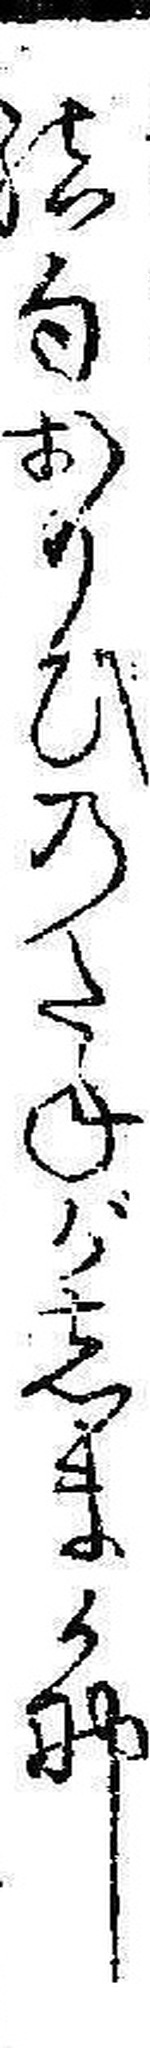結句おりひのたねがしまかな
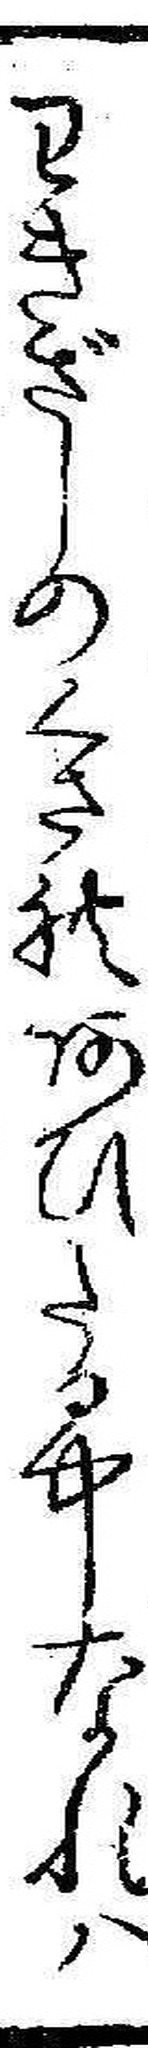わきざしのくされあひたる中なれは
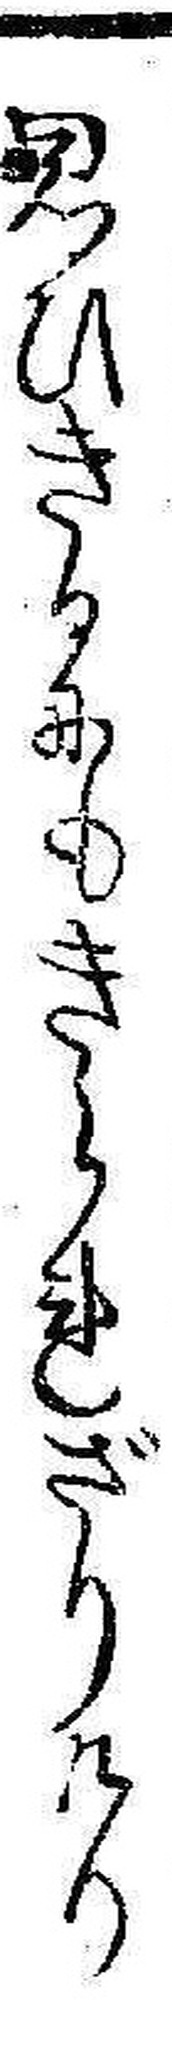思ひきるにもきられざりけり

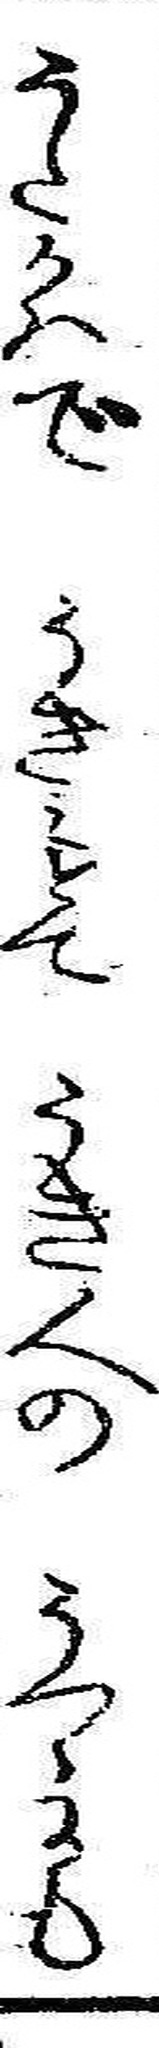うたかはでうきみとてうき人のうつゝにも
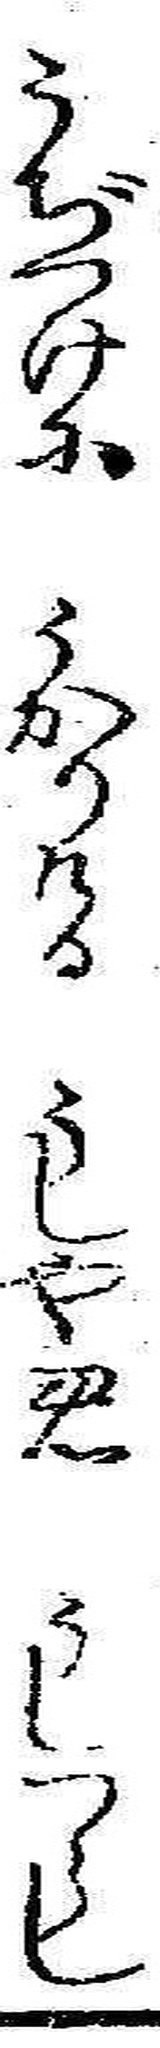うぢつけてうかりけるうしや君うしつらし
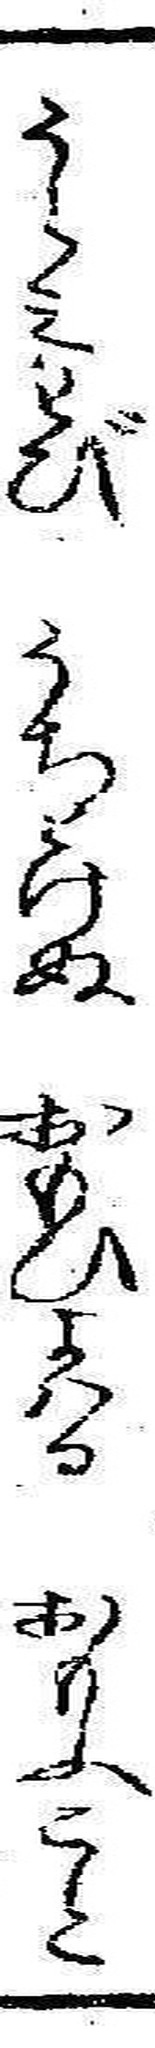うらみわびうちとけぬおもひよはるおもふこと
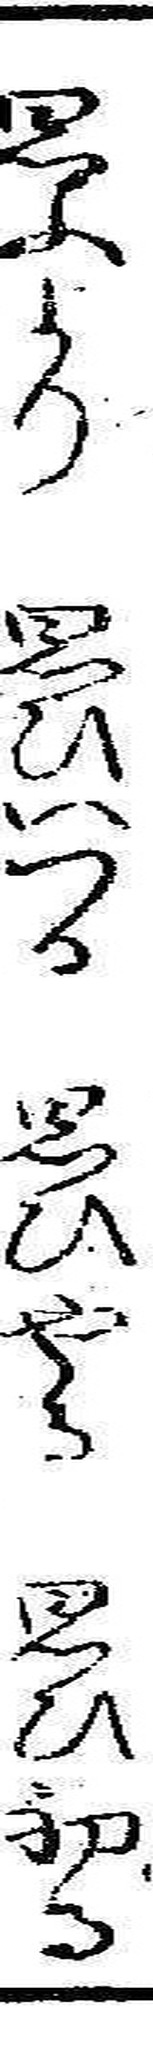思ふより思ひいつる思ひやる思ひ初る
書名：狂哥はまのきさご
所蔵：国文学研究資料館
